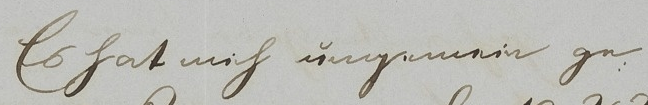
Es hat mich ungemein ge-
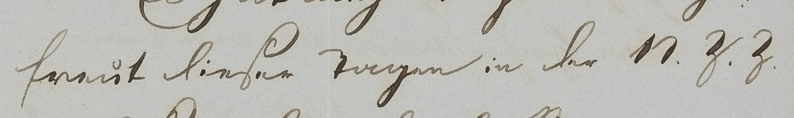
freut dieser Tagen in der N.Z.Z.
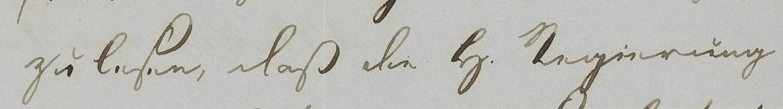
zu lesen, daß die H. Regierung
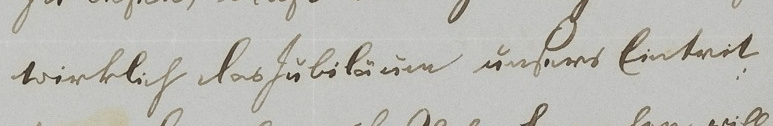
wirklich das Jubiläum unsers Eintrit-
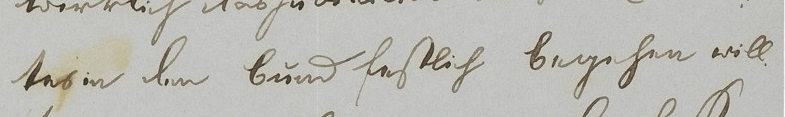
tes in den Bund festlich begehen will.
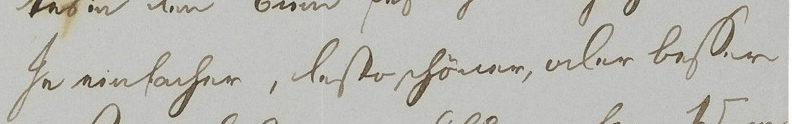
Je einfacher, desto schöner, oder beßer
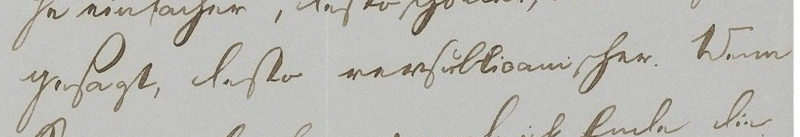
gesagt, desto republicanischer. Wenn
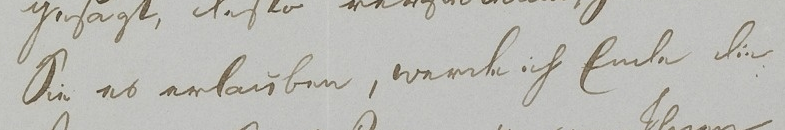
Sie es erlauben, werde ich Ende die-
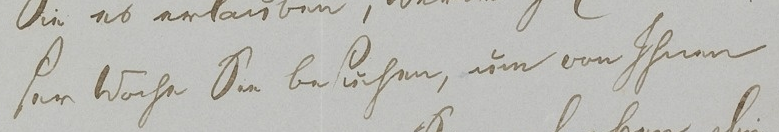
ser Woche Sie besuchen, um von Ihnen
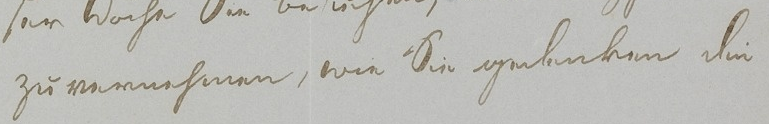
zu vernehmen, wie Sie gedenken die
